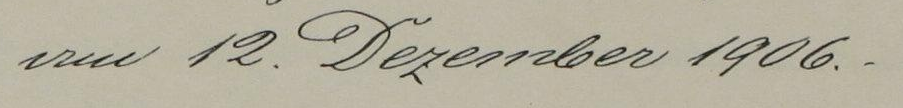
am 12. Dezember 1906.
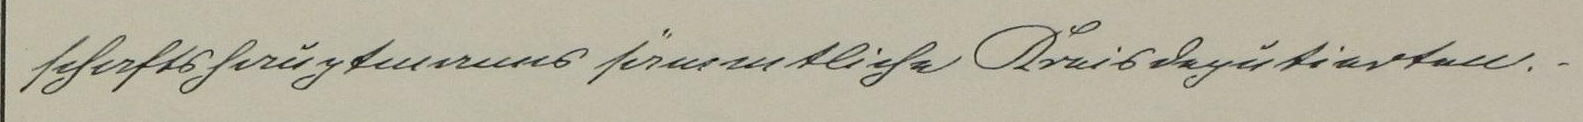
schaftshauptmanns sämmtliche Kreisdeputierten.
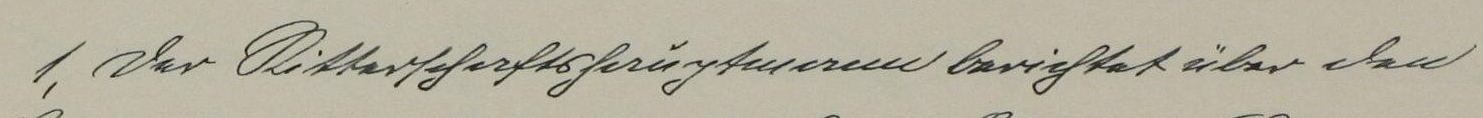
1. Der Ritterschaftshauptmann berichtet über den
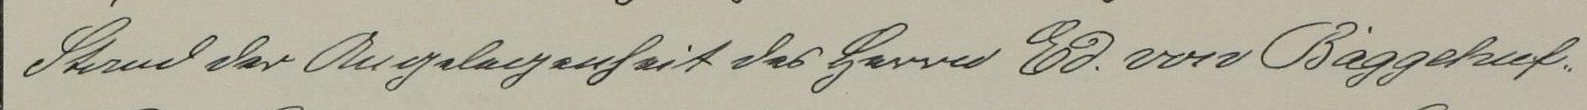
Stand der Angelegenheit des Herrn Ed. von Baggehuf-
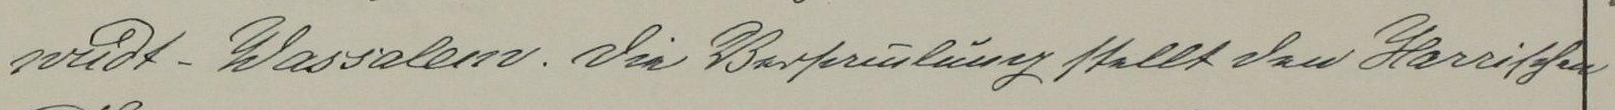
wudt-Wassalem. Die Versammlung stellt den Harrischen
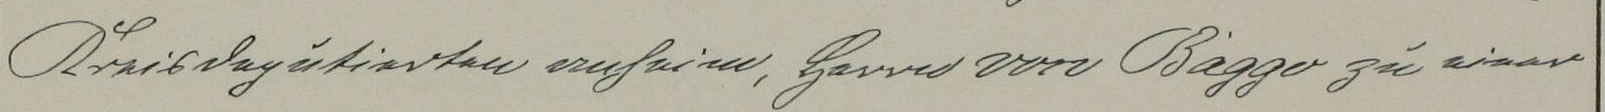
Kreisdeputierten anheim, Herrn von Baggo zu einer
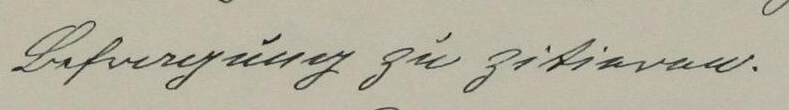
Befragung zu zitieren.
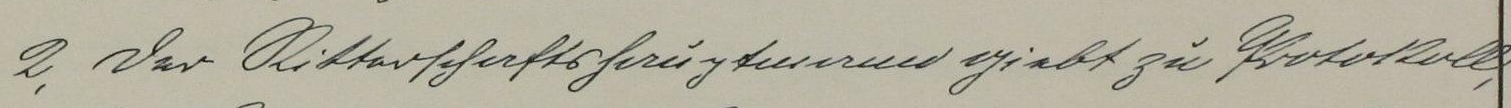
2. Der Ritterschaftshauptmann giebt zu Protokoll,
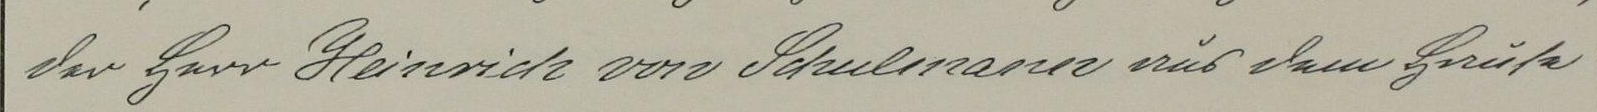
der Herr Heinrich von Schulmann aus dem Hause
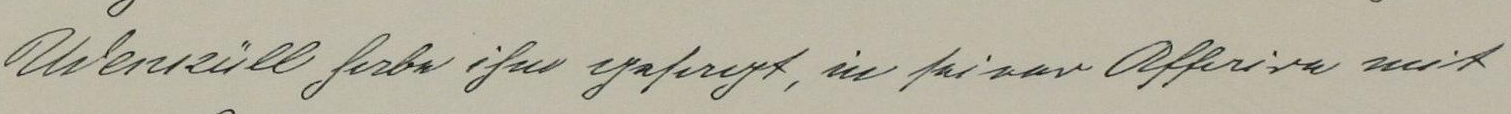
Udenküll habe ihm gesagt, in seiner Affaire mit
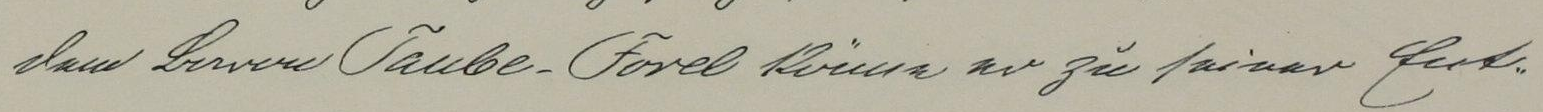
dem Baron Taube-Forel könne er zu seiner Ent-
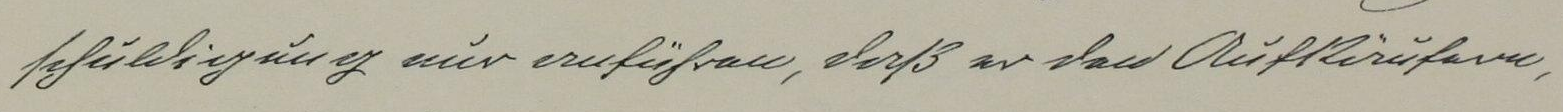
schuldigung nur anführen, daß er den Aufkäufern,
